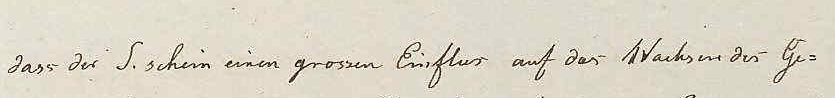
dass der S.schein einen grossen Einflus auf das Wachsen des Ge-
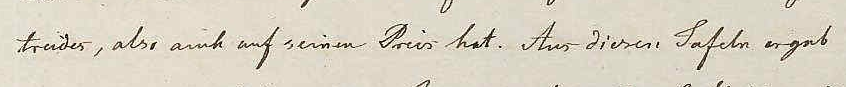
treides, also auch auf seinen Preis hat. Aus diesen Tafeln ergab
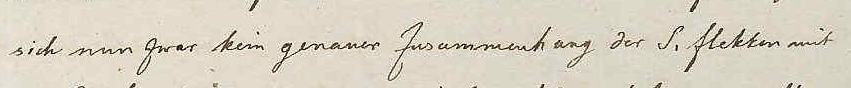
sich nun zwar kein genauer Zusammenhang der S.flekken mit
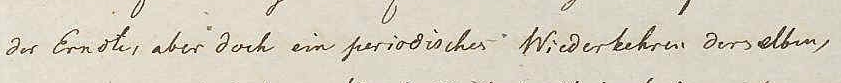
der Erndte, aber doch ein periodisches Wiederkehren derselben,
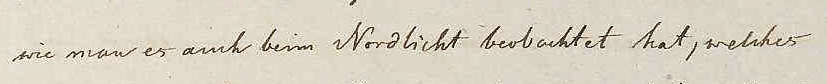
wie man es auch beim Nordlicht beobachtet hat, welches
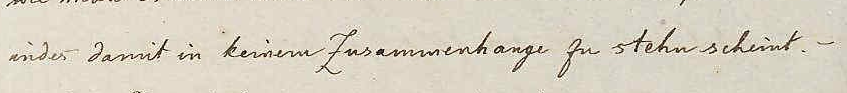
indes damit in keinem Zusammenhange zu stehn scheint. –
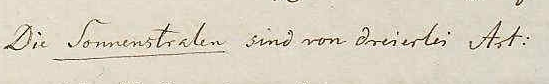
Die Sonnenstralen sind von dreierlei Art:
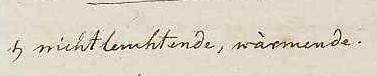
1, nichtleuchtende, wärmende.
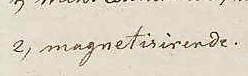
2, magnetisirende.
